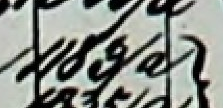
483/a
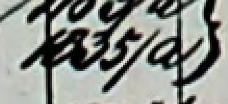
1335/a
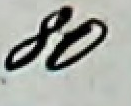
80
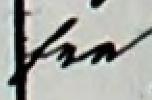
see
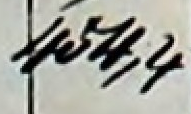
454,4
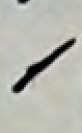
1
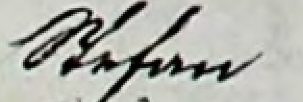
Stefan
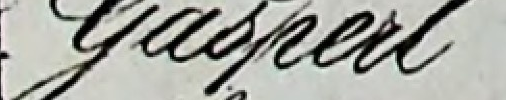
Gasperl
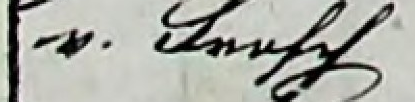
v. Frosch
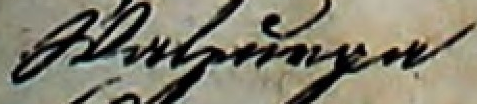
Walpurga
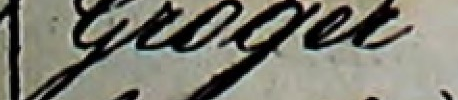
Groger
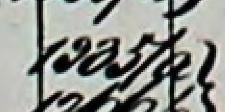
1335/a
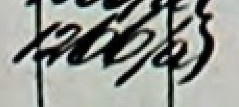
1266/a
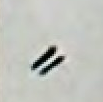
„
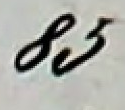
85
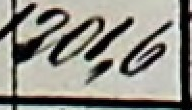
1201,6
